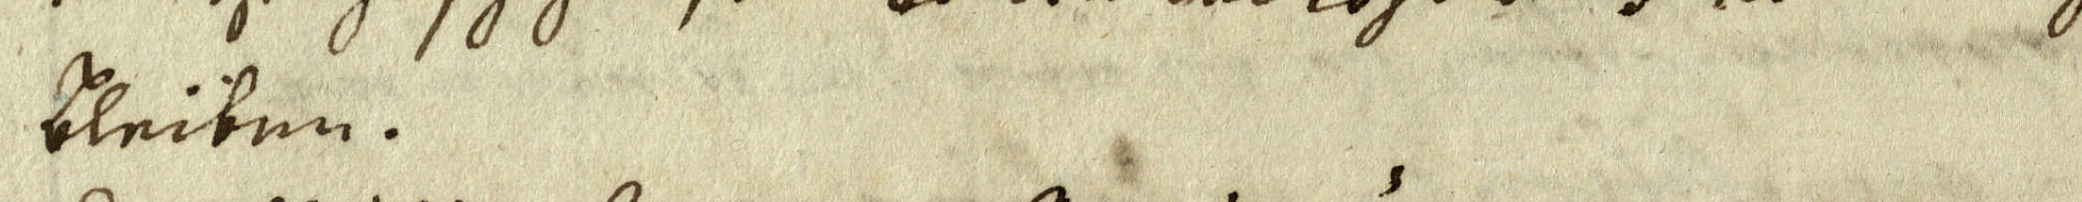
bleiben.
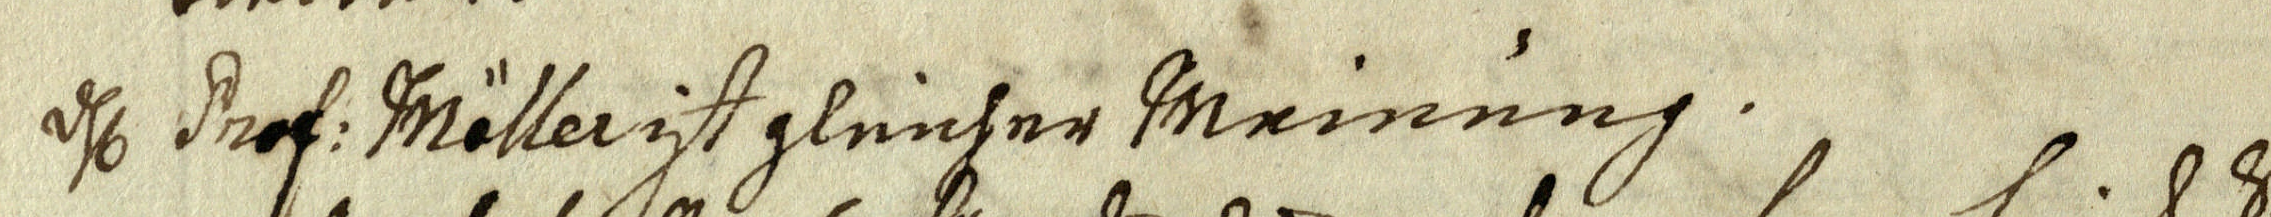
dh Prof. Möller ist gleicher Meinung.
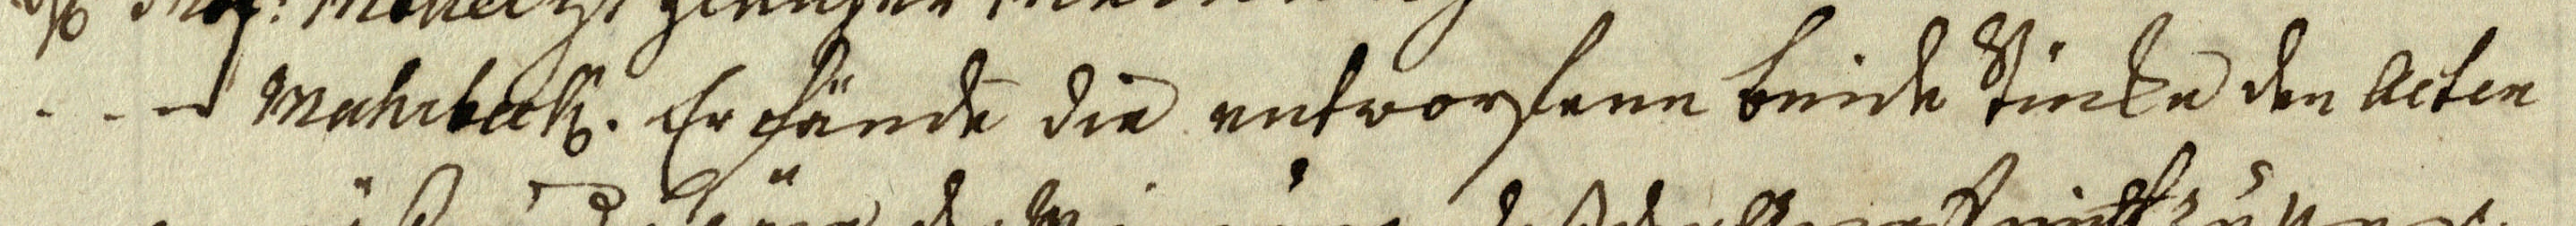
Muhrbeck. Er fände die entworfene beide Stücke den Acten
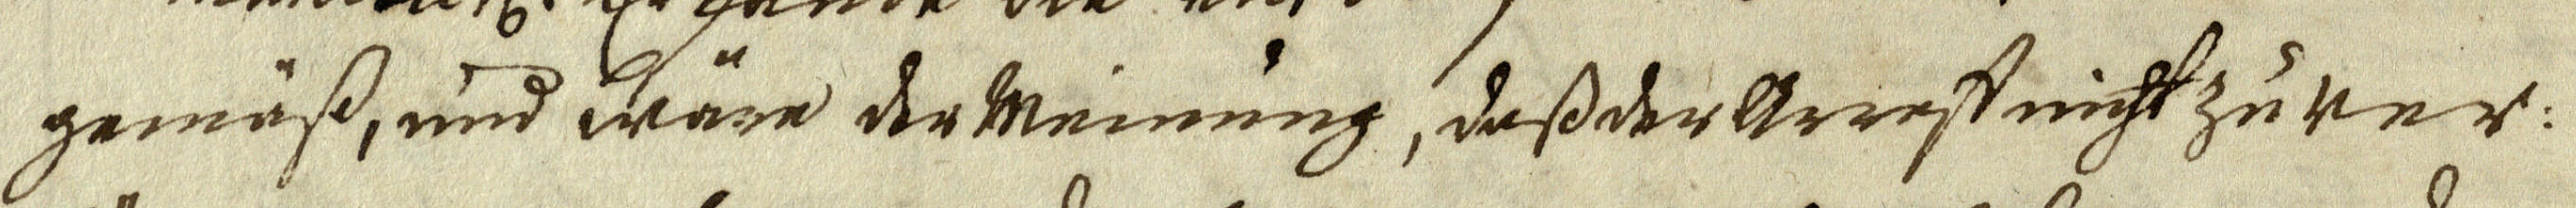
gemäß, und wäre der Meinung, daß der Arrest nicht zu ver¬
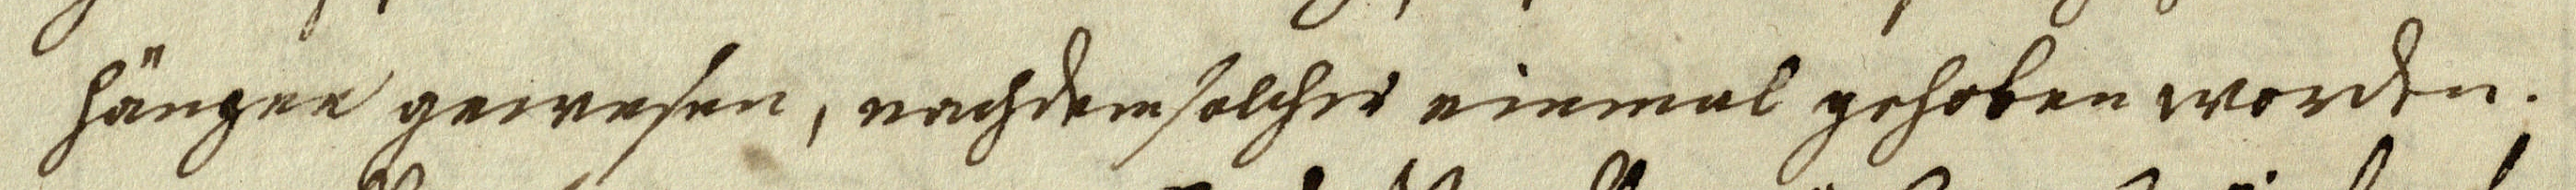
hängen gewesen, nachdem solcher einmal gehoben worden.
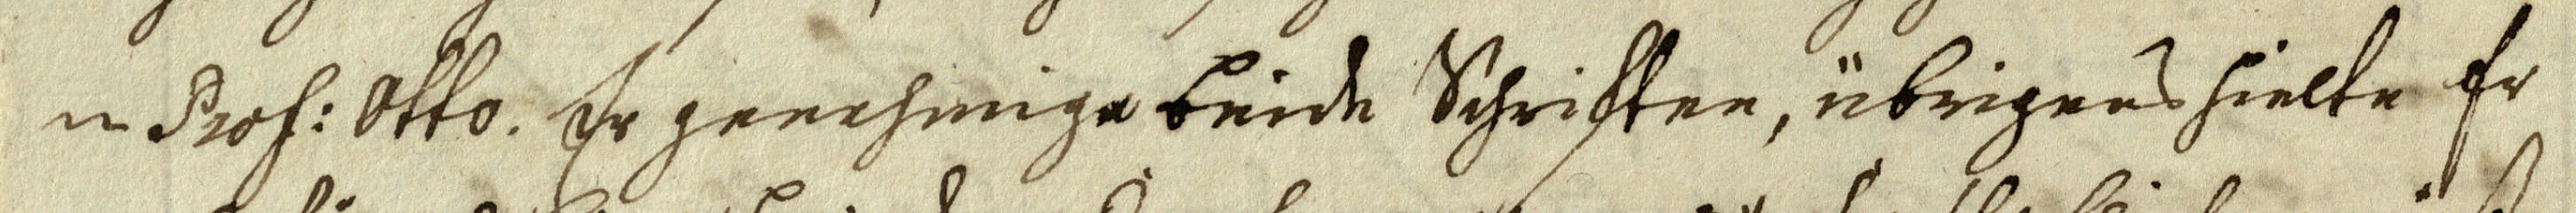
Prof. Otto. Er genehmige beide Schriften, übrigens hielte Er
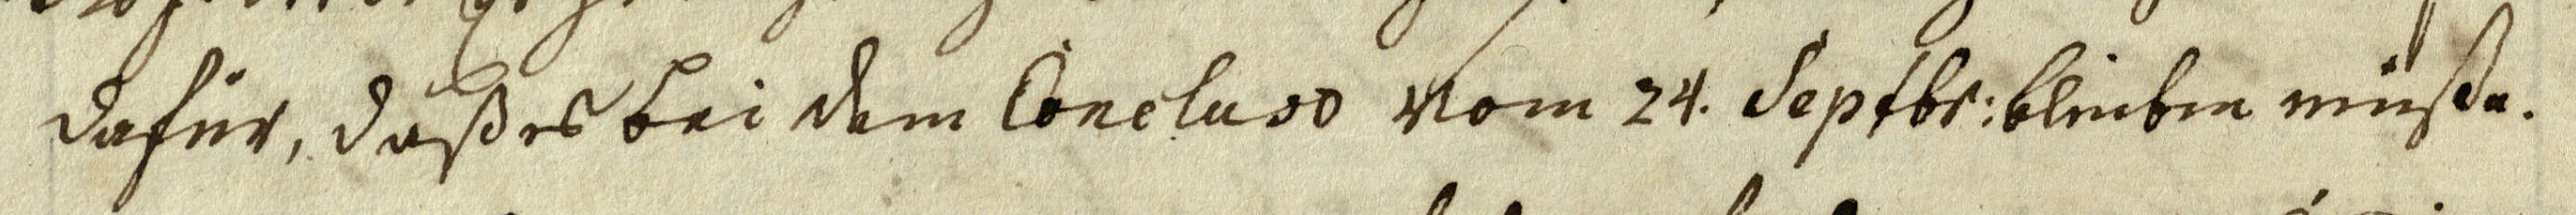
dafür, daß es bei dem Concluso vom 24. Septbr. bleiben müße.
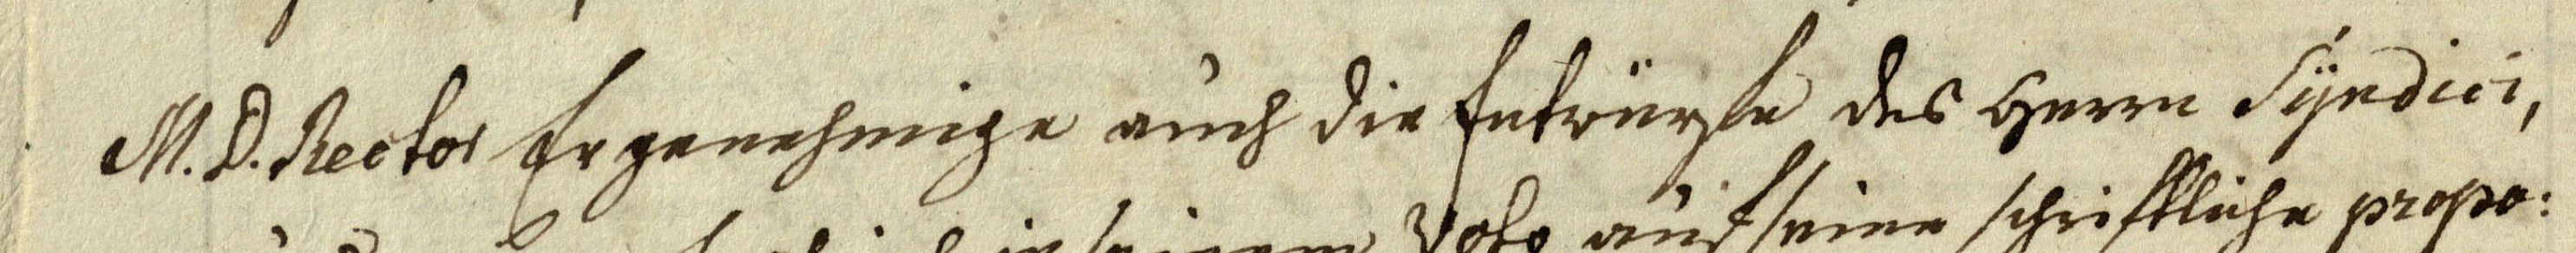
M. D. Rector. Er genehmige auch die Entwürfe des Herrn Sÿndici,
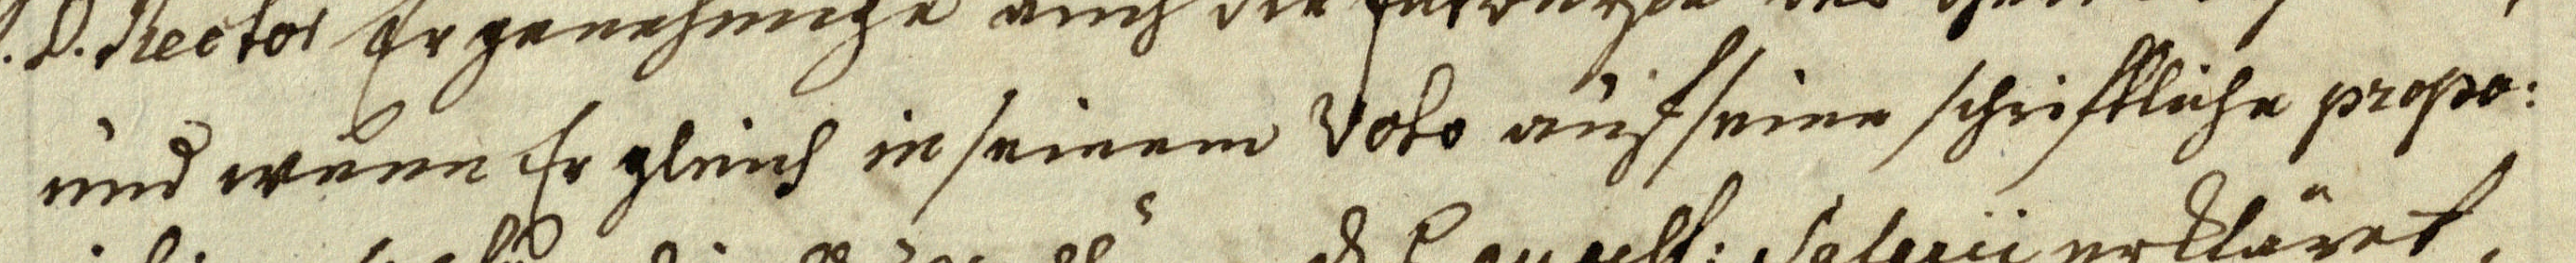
und wenn Er gleich in seinem Voto auf seine schriftliche propo¬
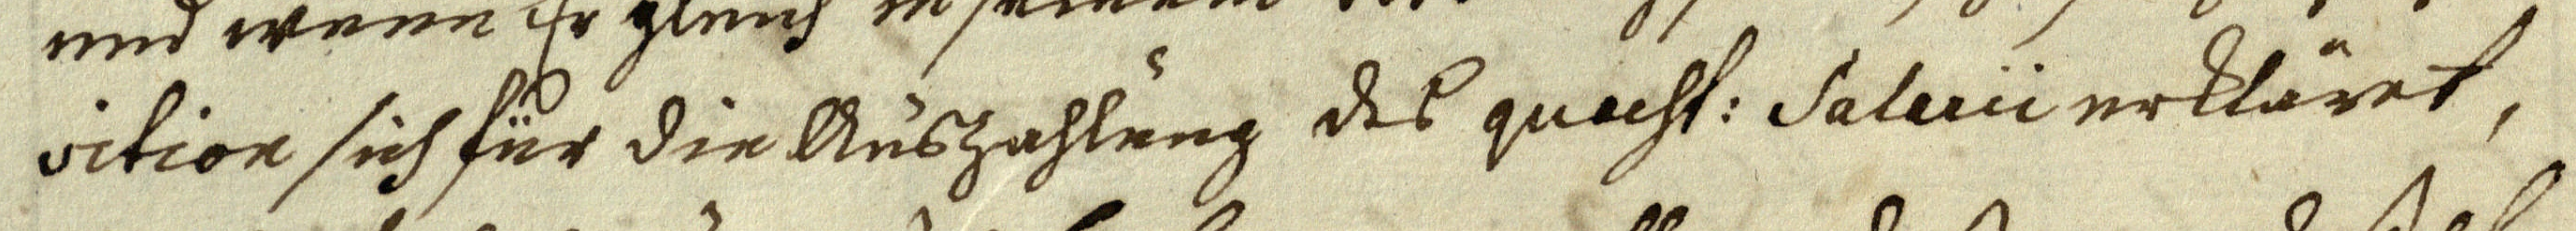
sition sich für die Auszahlung des quaest. Salarii erkläret,
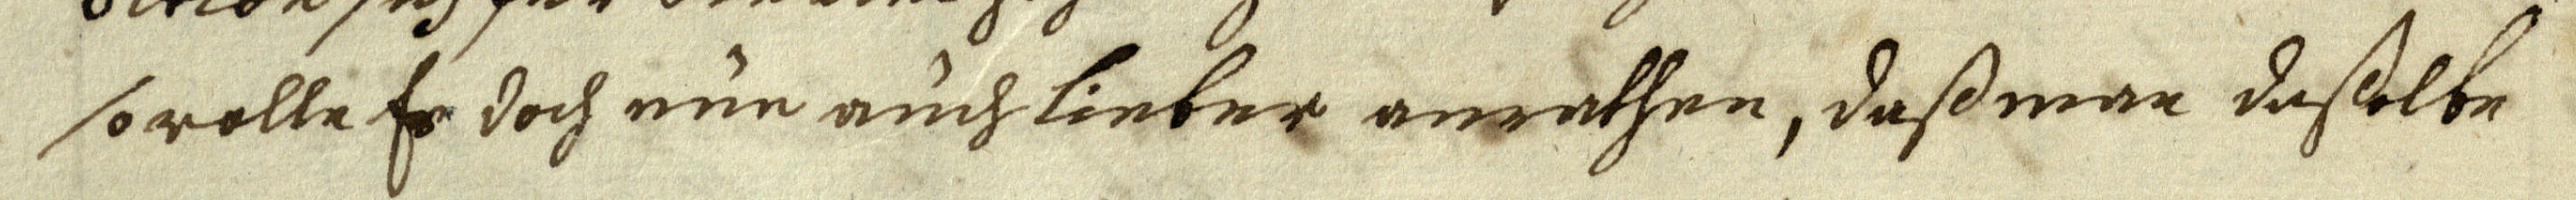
so wolle Er doch nun auch lieber anrathen, daß man daßelbe
